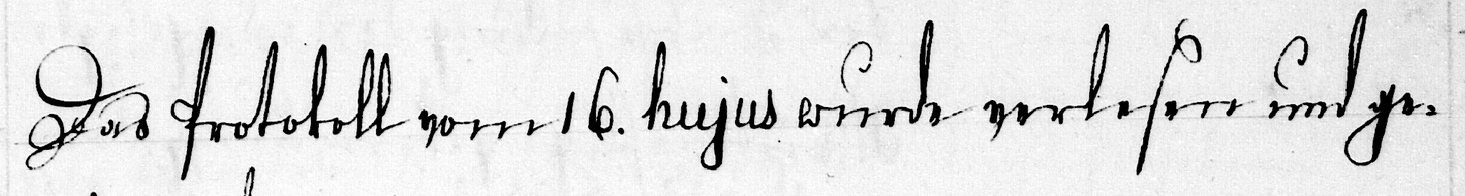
Das Protokoll vom 16. hujus wurde verlesen und ge¬
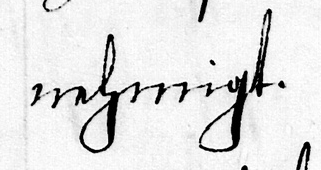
nehmigt.
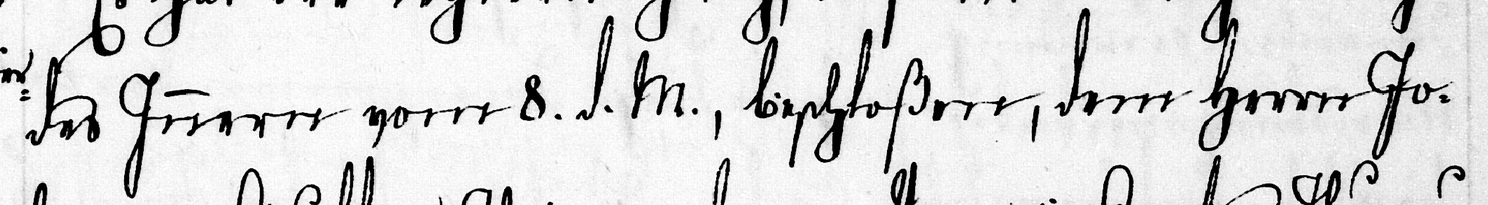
des Innern vom 8. d. M., beschloßen, dem Herrn Jo¬
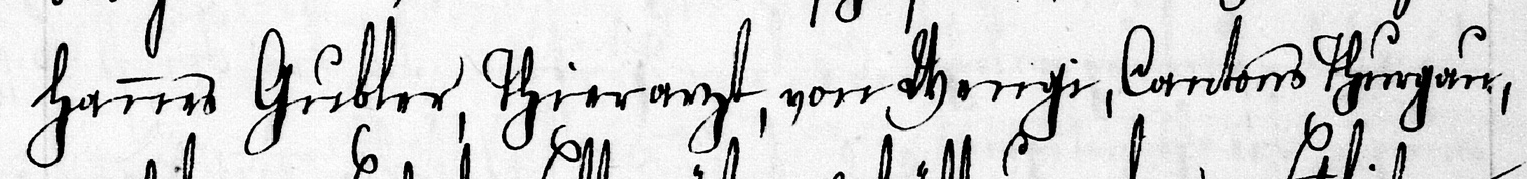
hannes Gubler, Thierarzt, von Wengi, Cantons Thurgau,
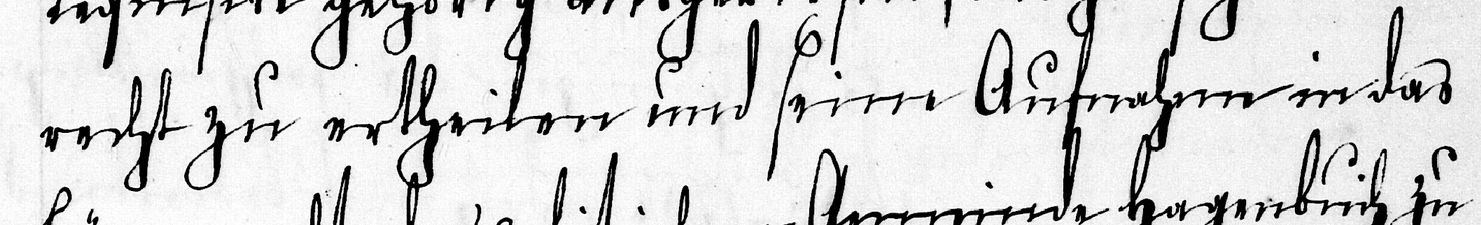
recht zu ertheilen und seine Aufnahme in das
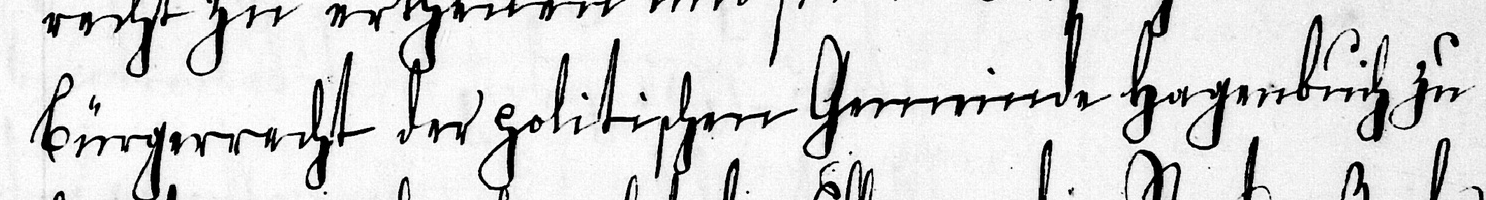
Bürgerrecht der politischen Gemeinde Hagenbuch zu
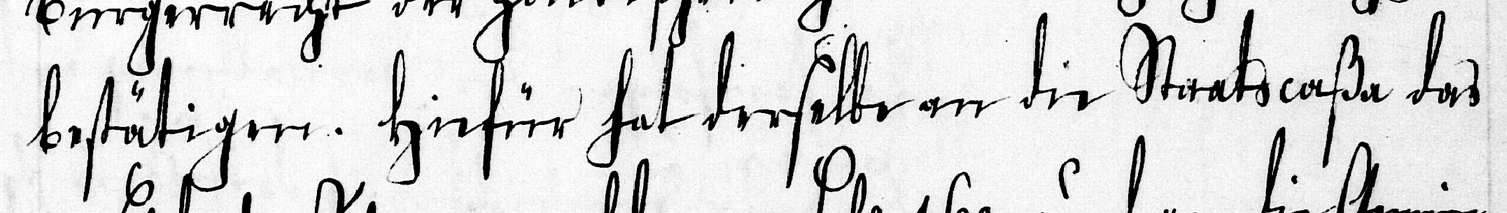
bestätigen. Hierfür hat derselbe an die Staatscaßa das
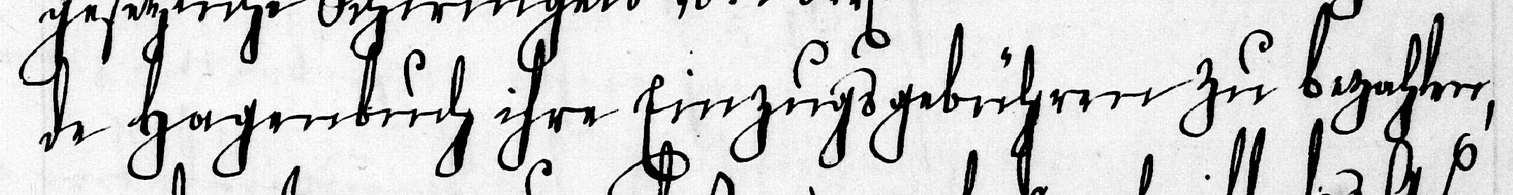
de Hagenbuch ihre Einzugsgebühren zu bezahlen,
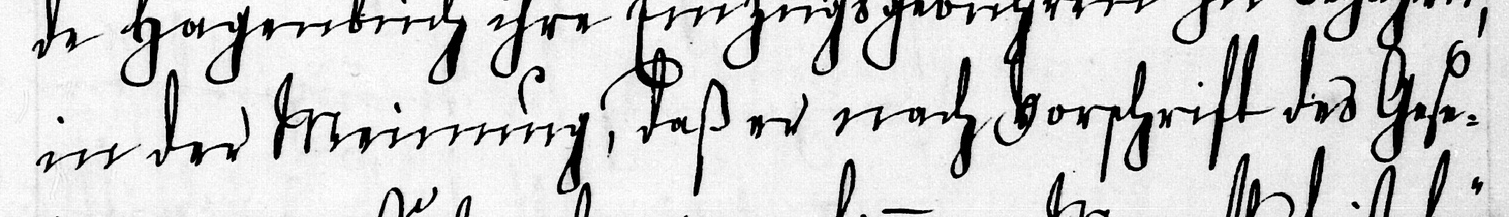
in der Meinung, daß er nach Vorschrift des Gese¬
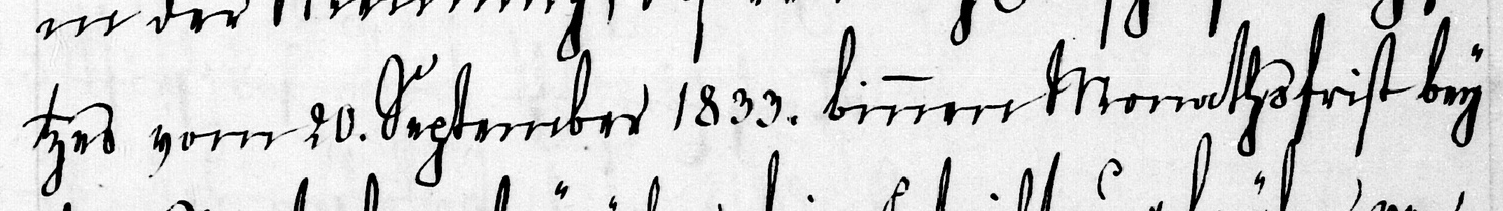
tzes vom 20. September 1833. binnen Monathsfrist bey
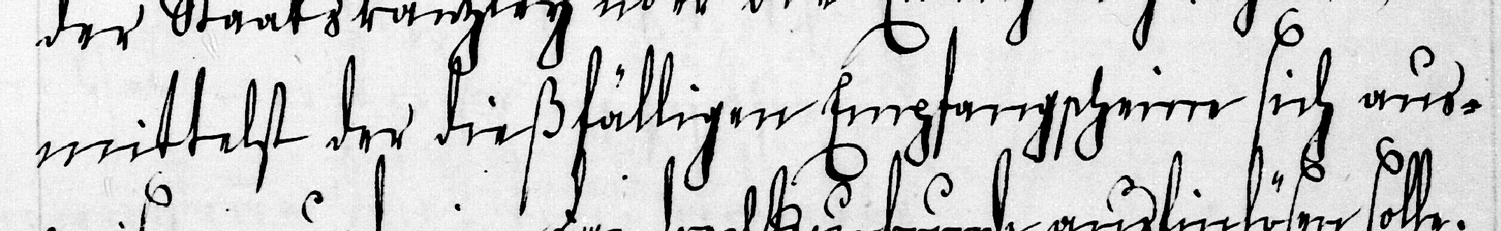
mittelst der dießfälligen Empfangscheine sich aus¬
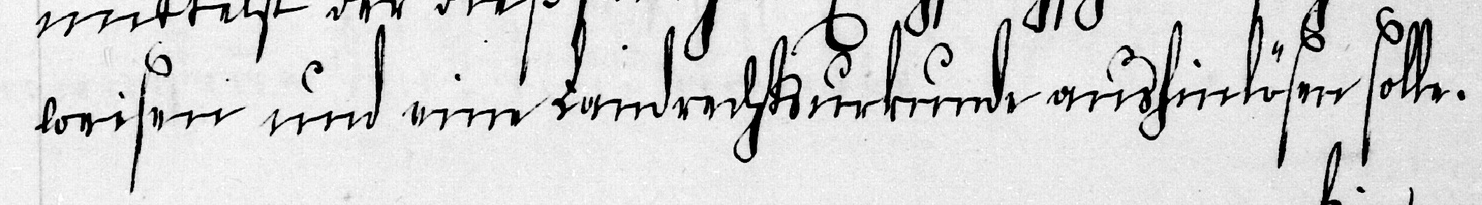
weisen und eine Landrechtsurkunde aushinlösen soll¬
